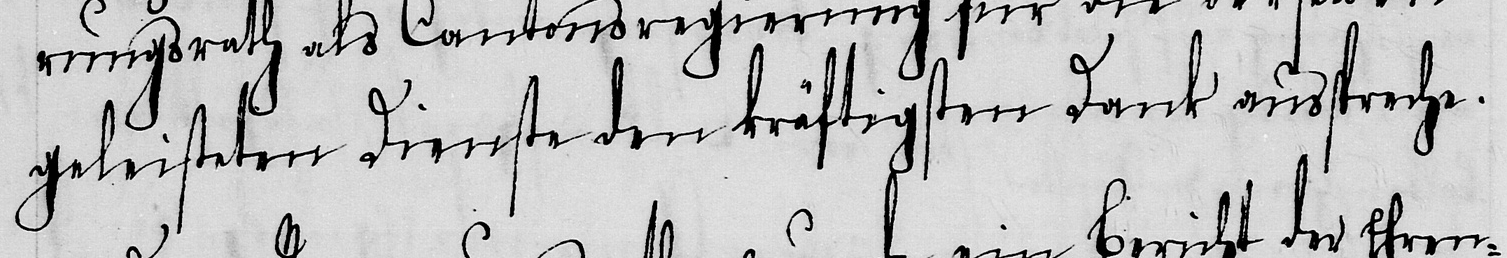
geleisteten Dienste den kräftigsten Dank ausspreche.
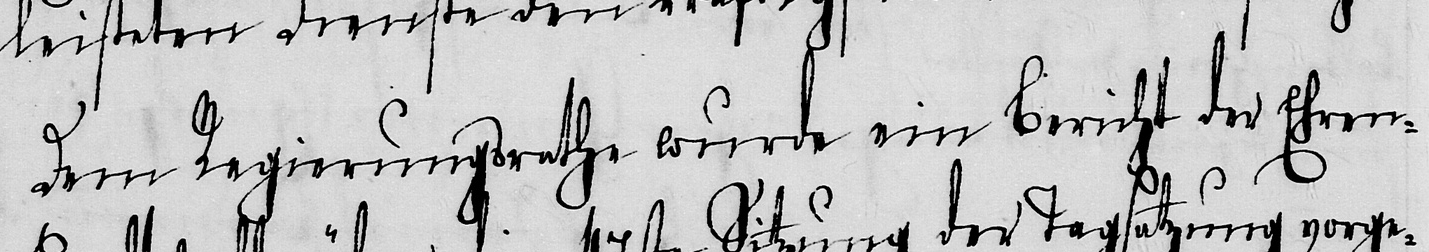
Dem Regierungsrathe wurde ein Bericht der Ehren¬
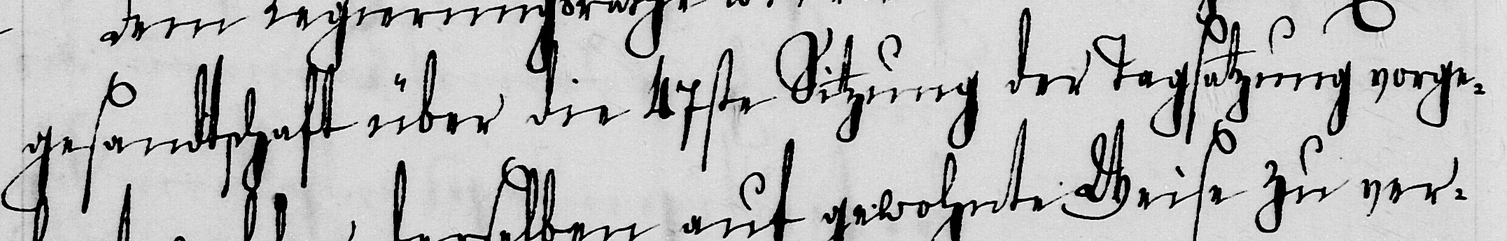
gesandtschaft über die 47ste Sitzung der Tagsatzung vorge¬
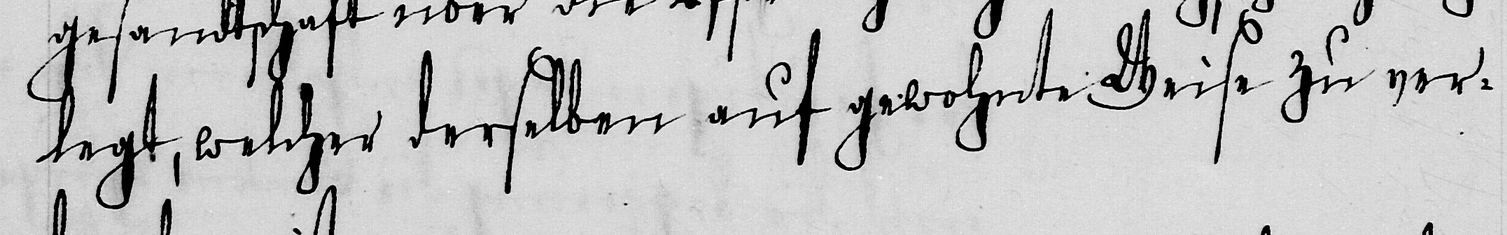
legt, welcher derselben auf gewohnte Weise zu ver¬
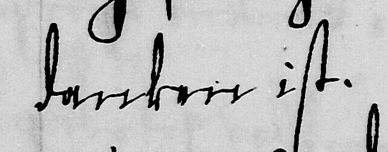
danken ist.
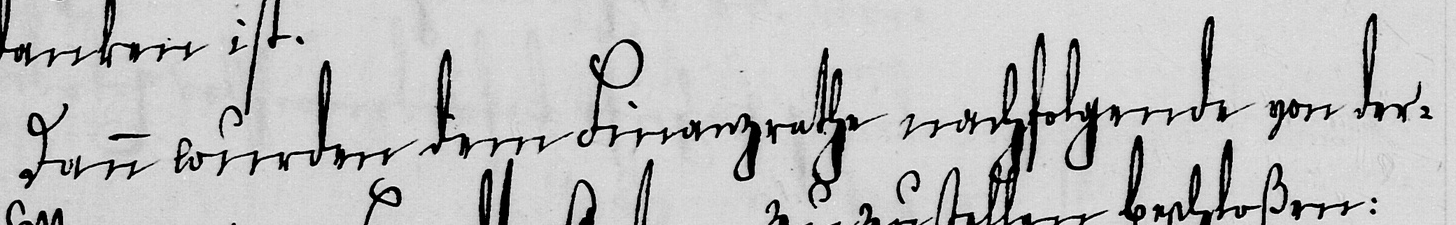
Dann wurden dem Finanzrathe nachfolgende von der¬
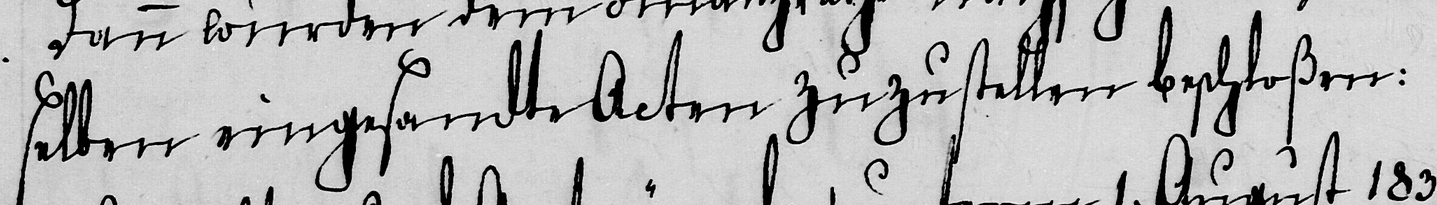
selben eingesandte Acten zuzustellen beschloßen:
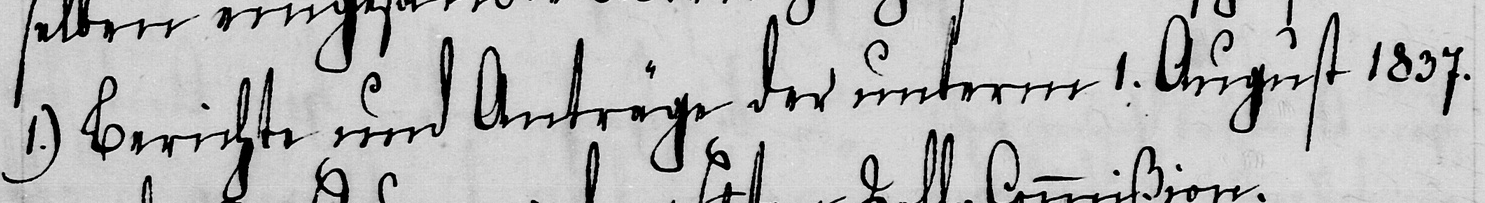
1.) Berichte und Anträge der unterm 1. August 1837.
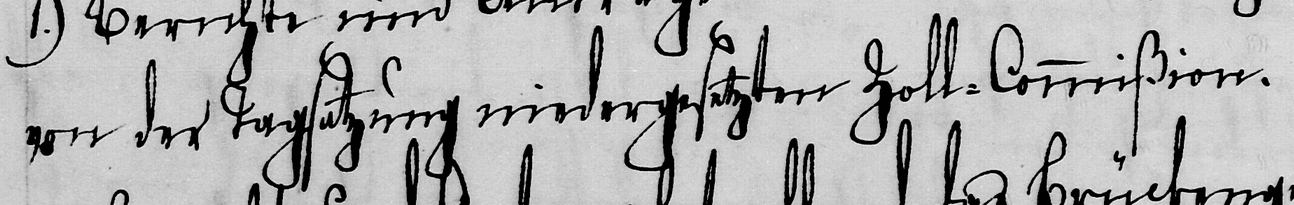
von der Tagsatzung niedergesetzten Zoll-Commißion.
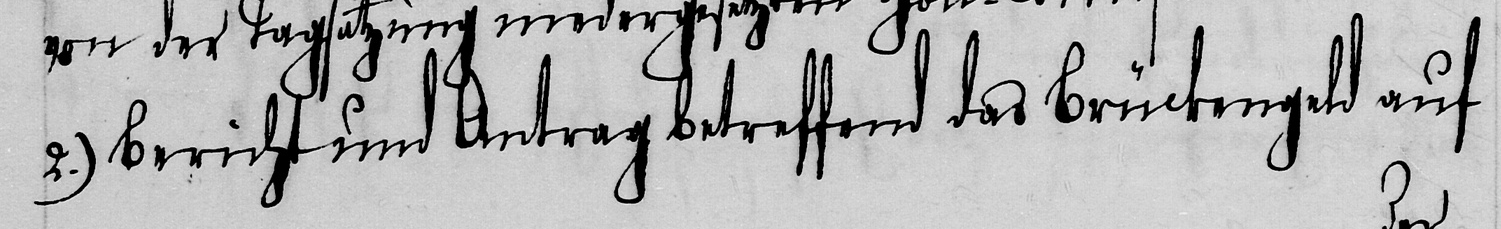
2.) Bericht und Antrag betreffend das Brückengeld auf
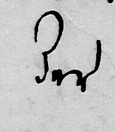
er
